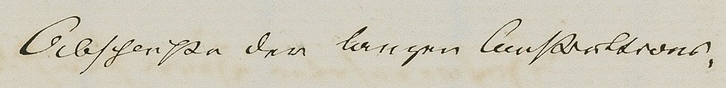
Abschluße der langen Construktions-
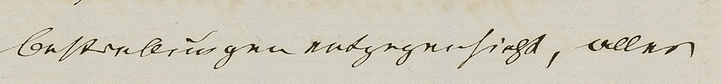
bestrebungen entgegensieht, alles
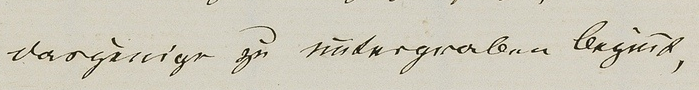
dasjenige zu untergraben beginnt,
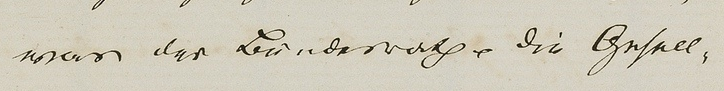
was der Bundesrath & die Gesell-
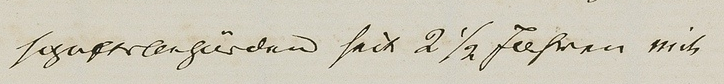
schaftsbehörden seit 2½ Jahren mit
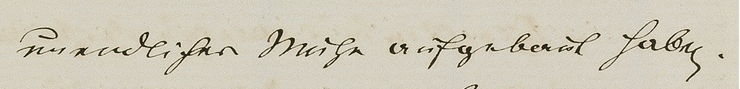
unendlicher Mühe aufgebaut haben.
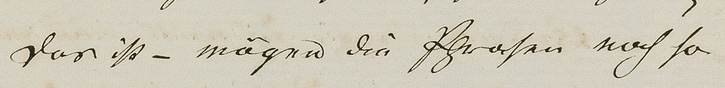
Das ist – mögen die Phrasen noch so
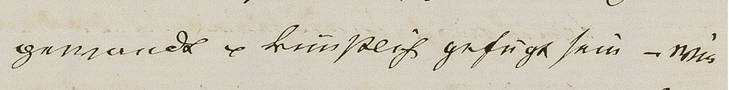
gewandt & künstlich gefügt sein – wie
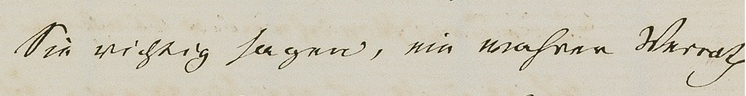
Sie richtig sagen, ein wahrer Verrath
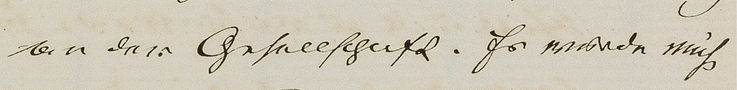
an der Gesellschaft. Es würde mich
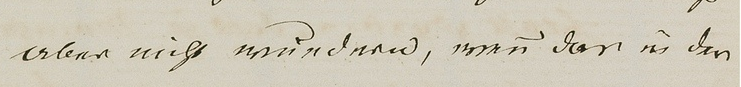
aber nicht wundern, wenn das in der
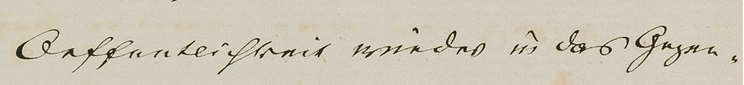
Oeffentlichkeit wieder in das Gegen-
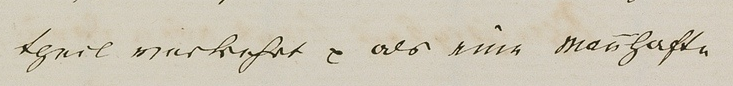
theil verkehrt & als eine mannhafte
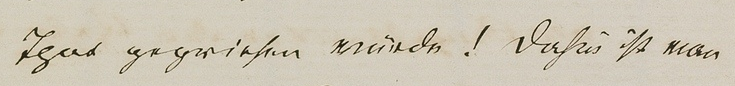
That gepriesen würde! Dahin ist man
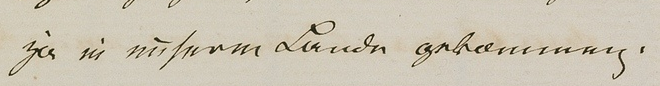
ja in unserem Lande gekommen.
